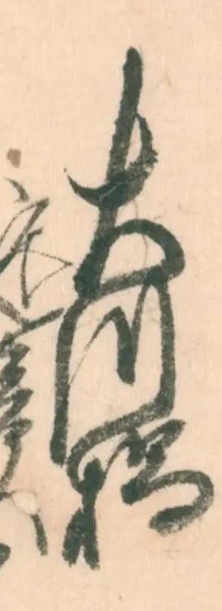大川橋
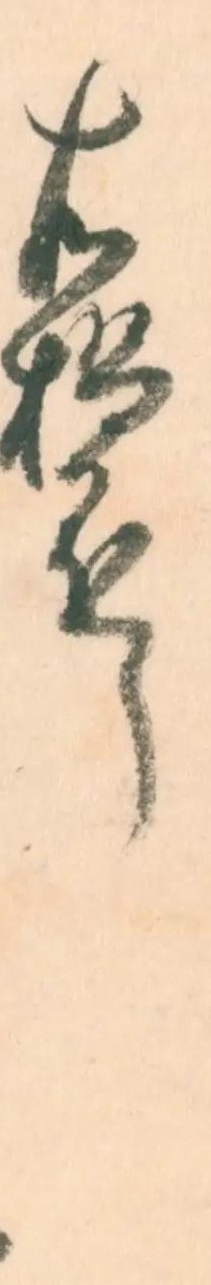右橋懸リ
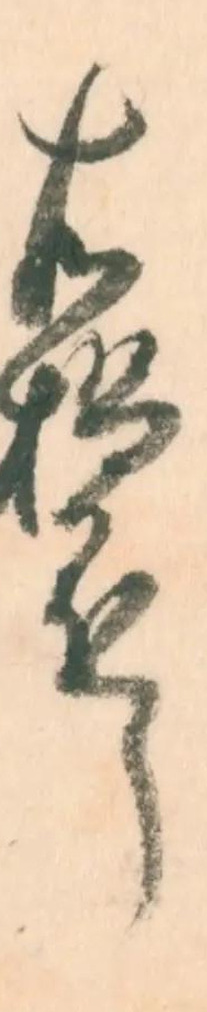右橋懸リ
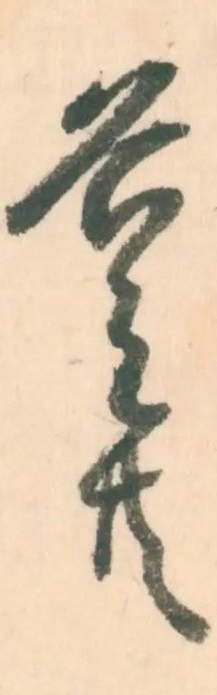名主共

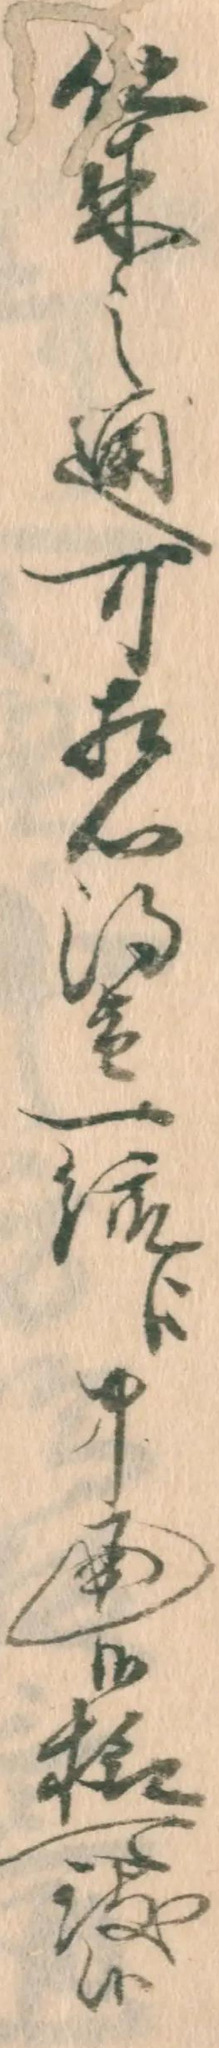仕来之通可相心得置一統え申達候様可致候
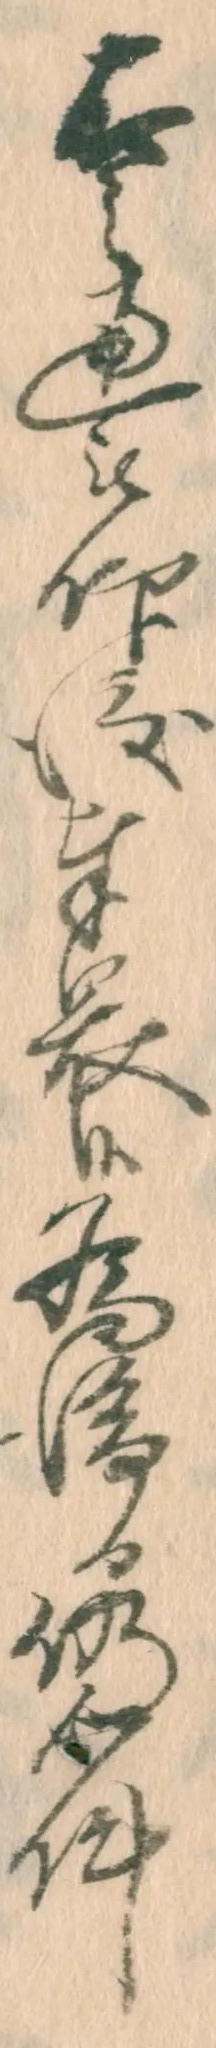右之通被仰渡奉畏候為後日仍如件
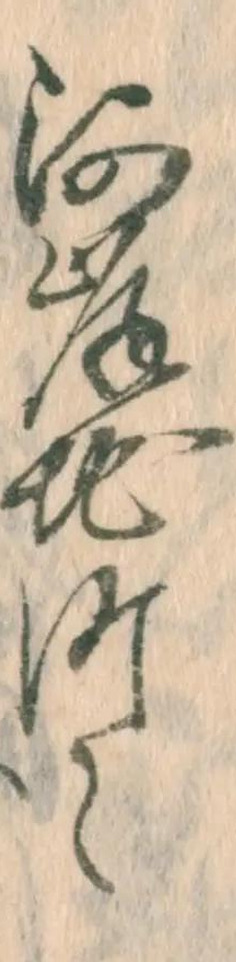河岸地町々
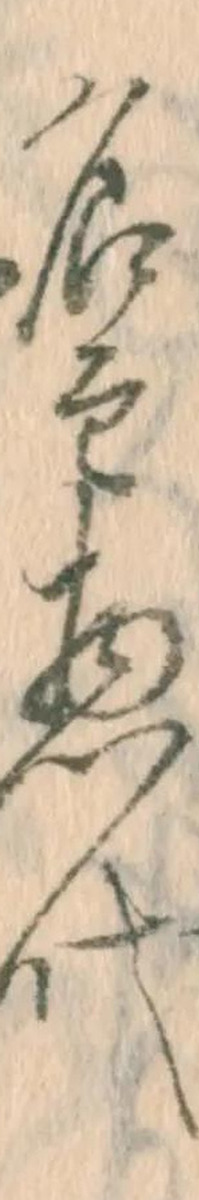名主惣代
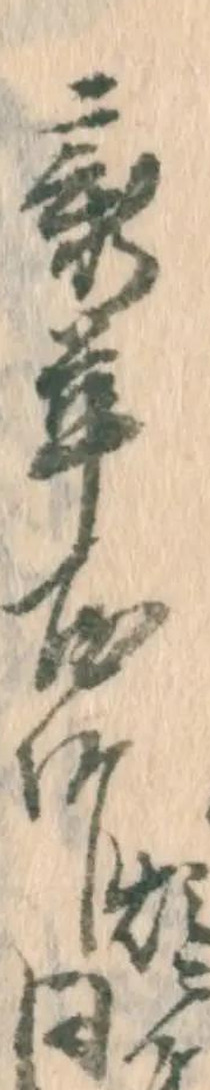新革屋町同
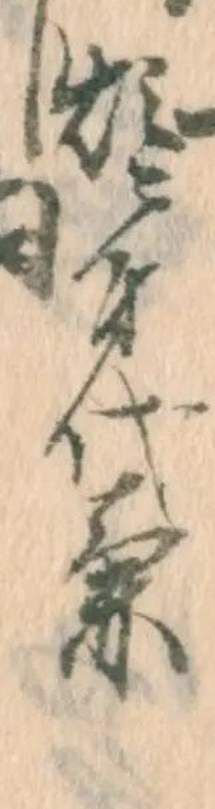煩ニ付代兼
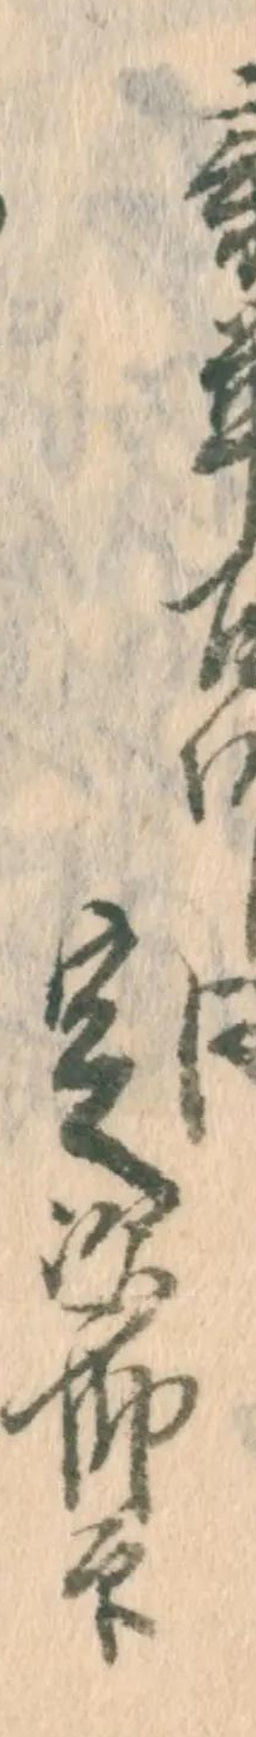定次郎印
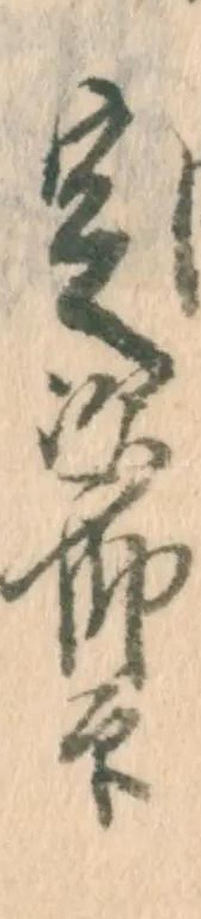定次郎印
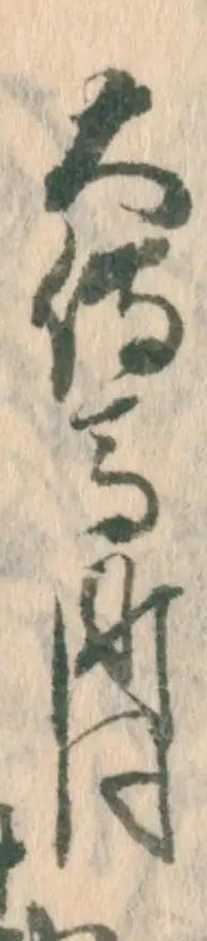大伝馬町同
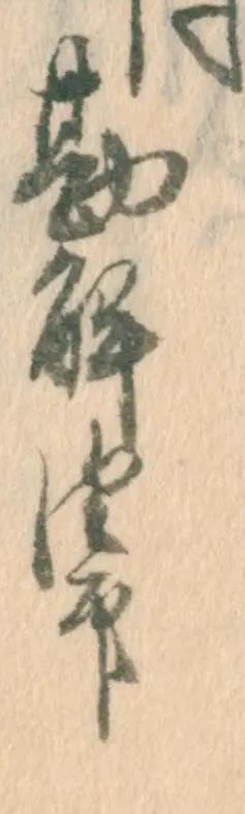勘解由印

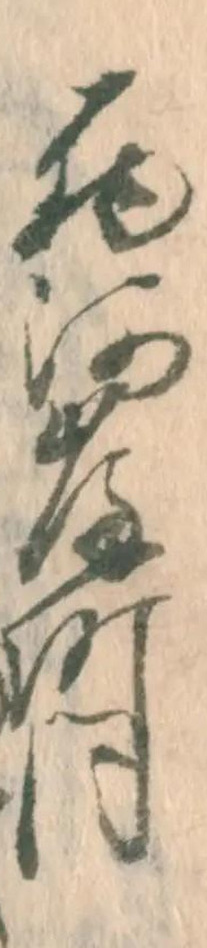西河岸町同
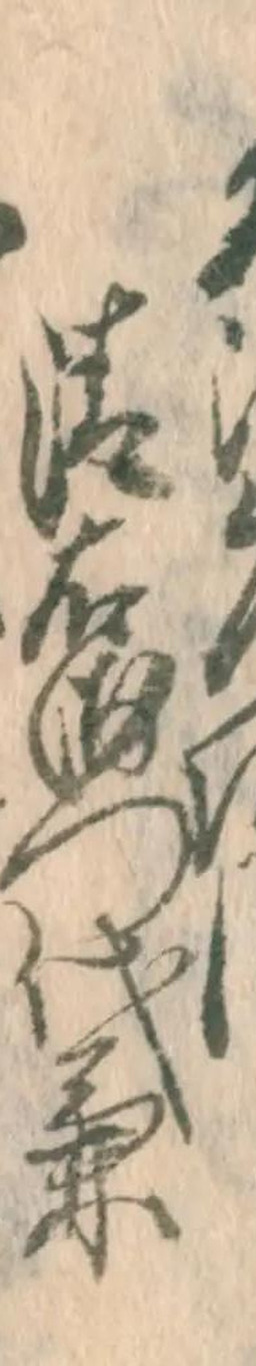清右衛門代兼
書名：地震災書留 2巻. [1] 内表紙に「地震災書留　安政二卯年　但本所深川御用屋敷地代免除調」とあり
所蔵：国立国会図書館 National Diet Library, JAPAN
